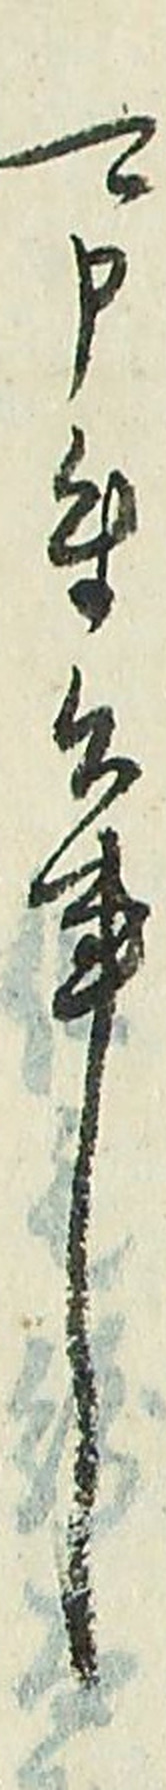可申付候事

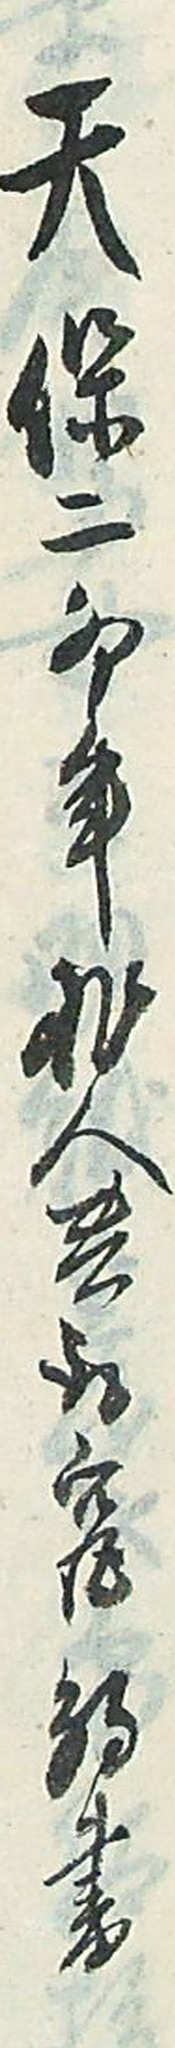天保二卯年非人共取究触書
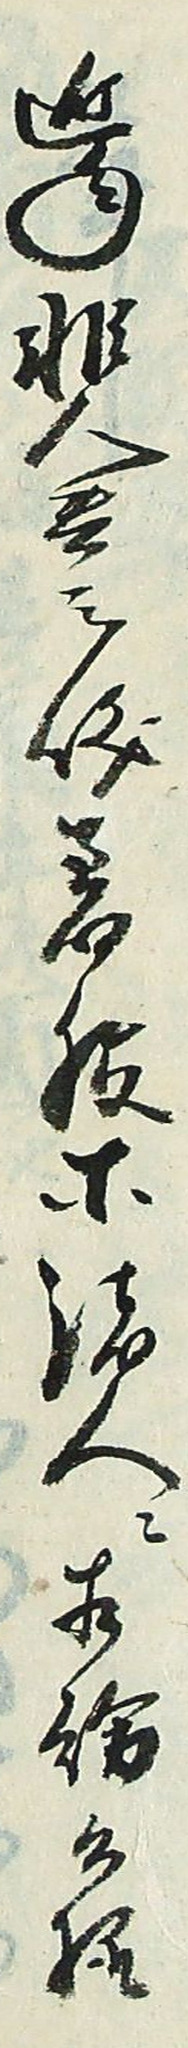近年非人共之儀着服等請人に相紛候様
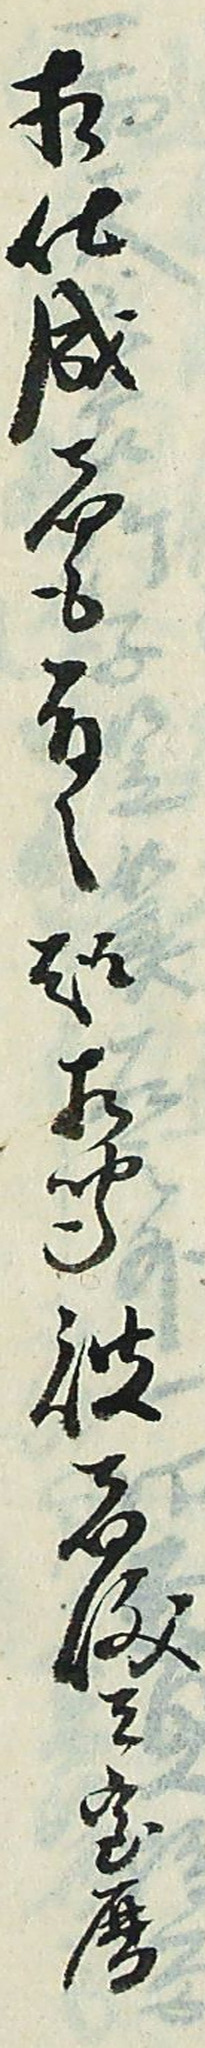相仕成者も有之趣相聞彼者儀は宝暦
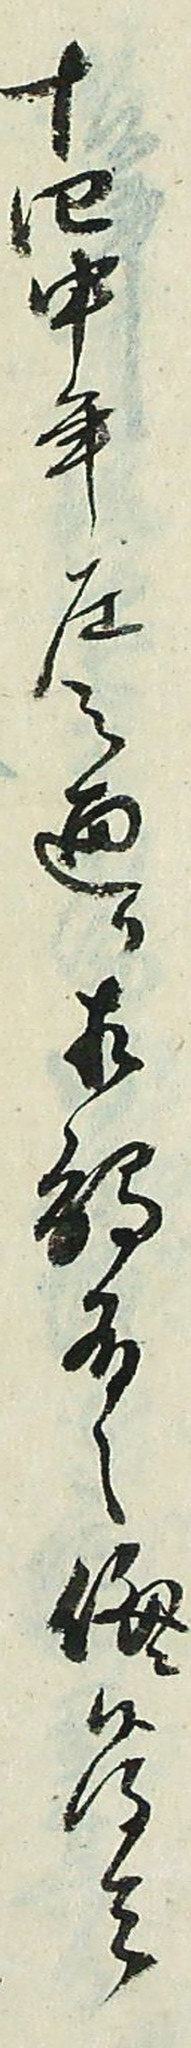十四申年左之通り相触有之儀に候得は
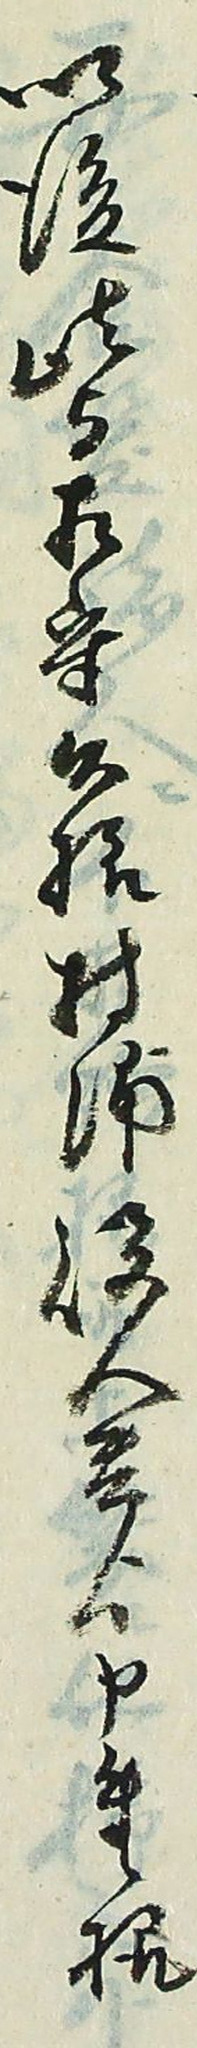以後屹と相守候様村浦役人共ゟ申付候様
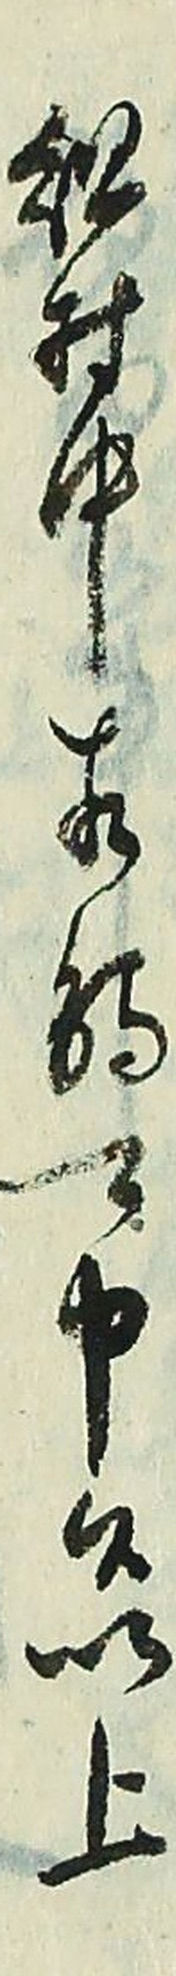組村中相触可申候以上
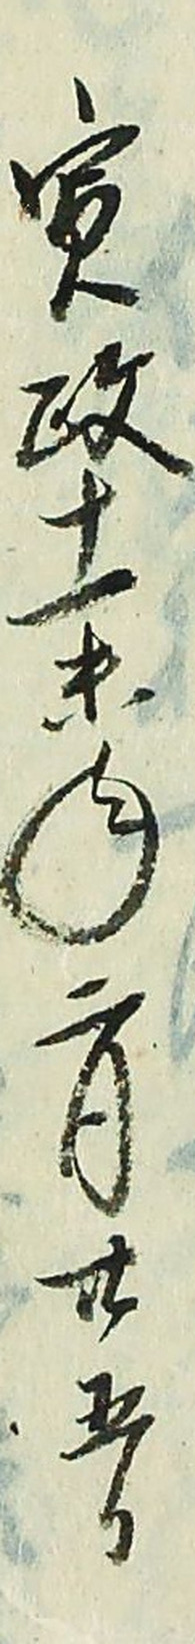寬政十一未年二月廿五日
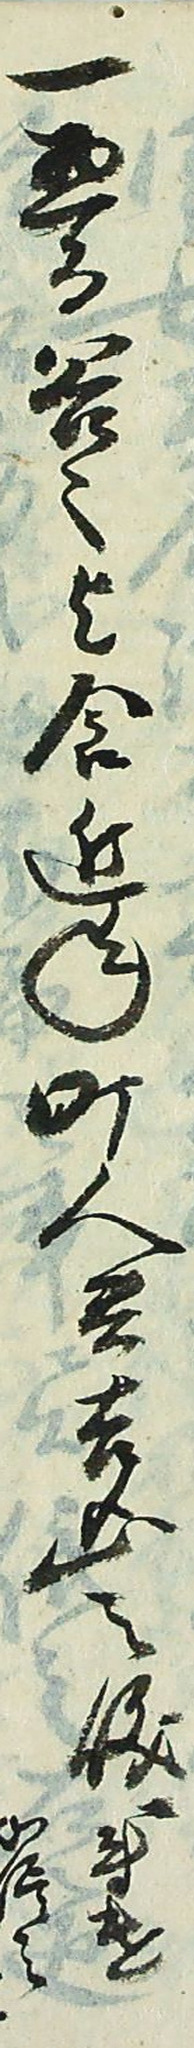一惣而谷々乞食近年町人共吉凶之儀に付遣
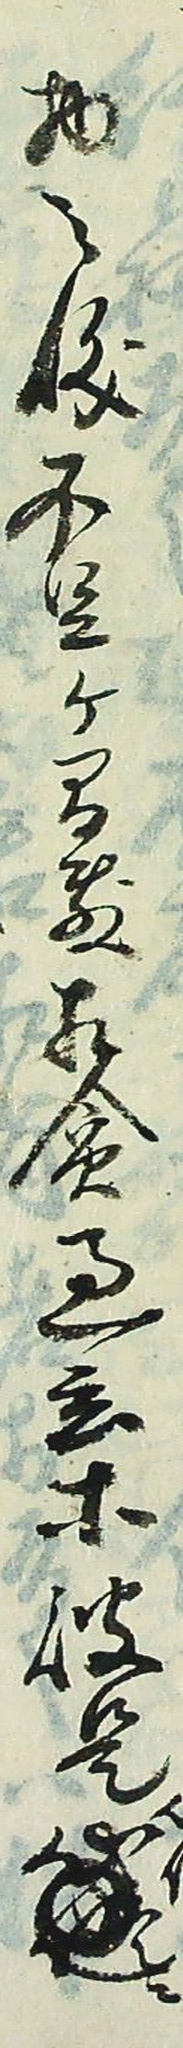物之儀不足ケ間敷相貪過言等彼是心侭之
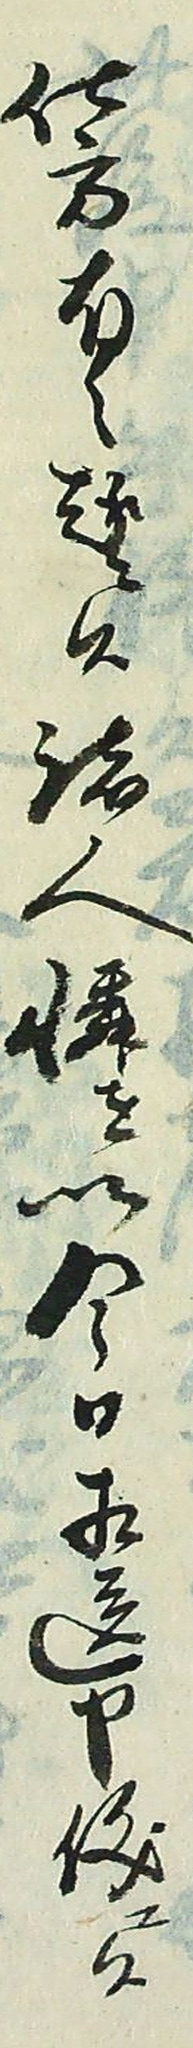仕方有之趣に候諸人憐を以今日相送申儀に候
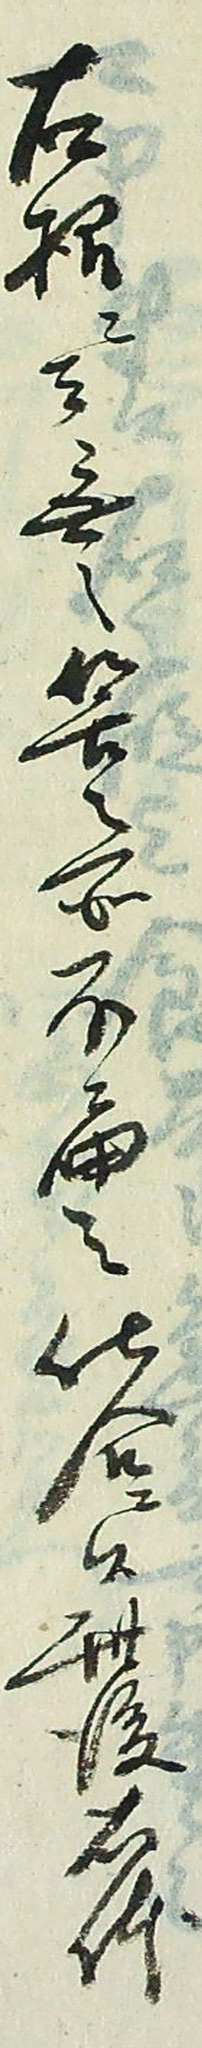右様には無之筈之所不届之仕合に候此後右体
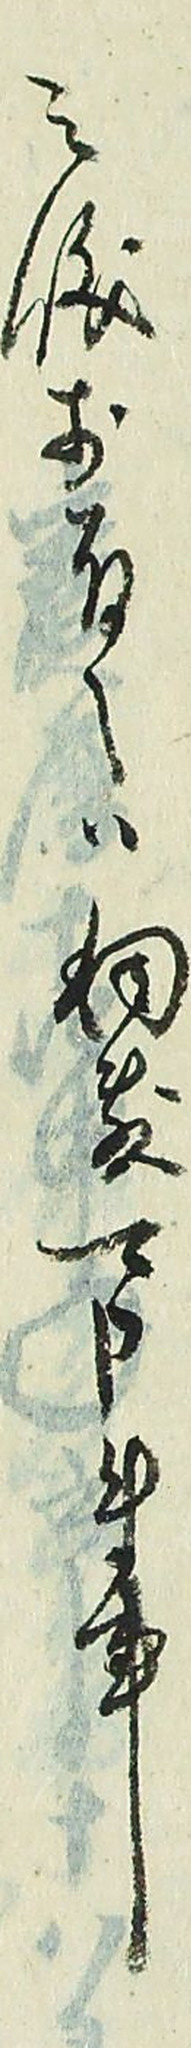之儀於有之は稠敷可申付事
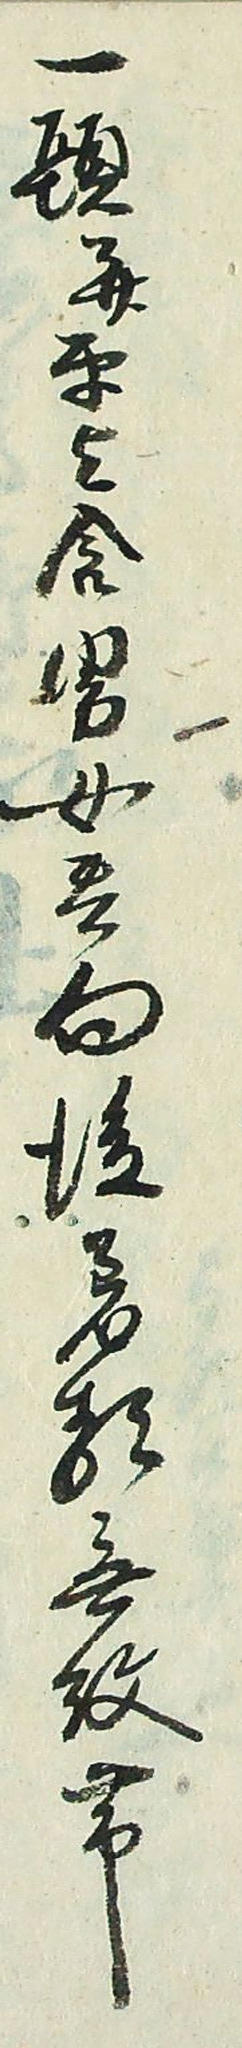一頭幷平乞食男女共向後着類無紋帯
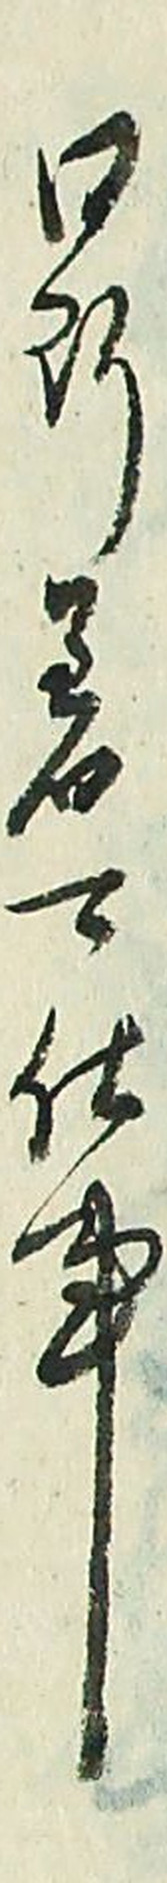同断着可仕事
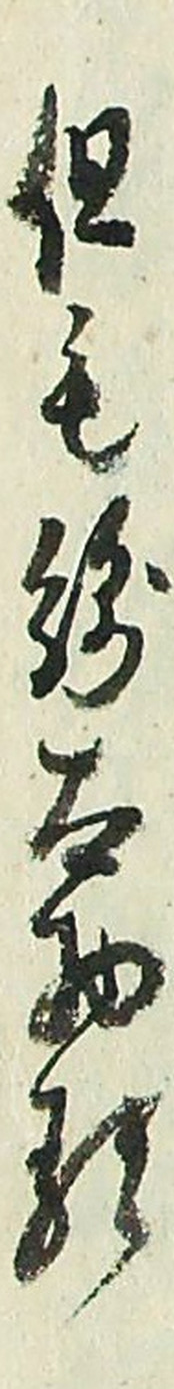但毛綿太者類
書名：諸御用御□受書控
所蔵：鳴門教育大学 Naruto University of Education
